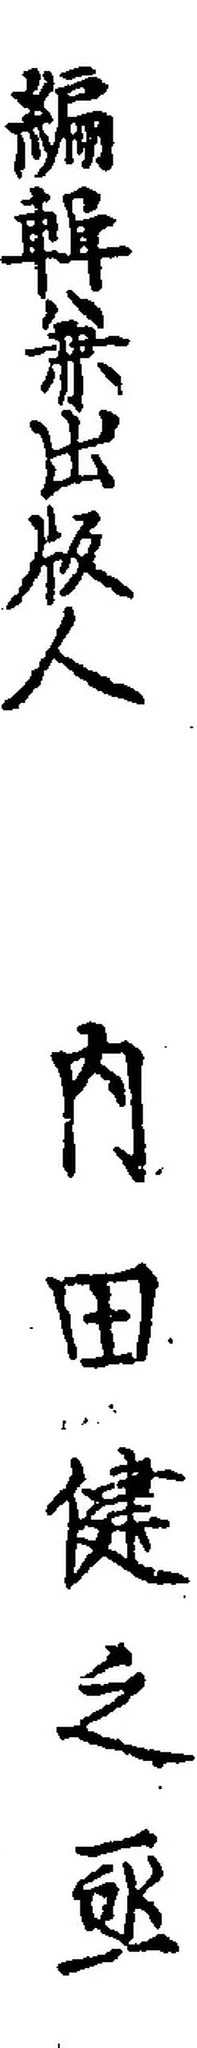編輯兼出版人内田健之丞
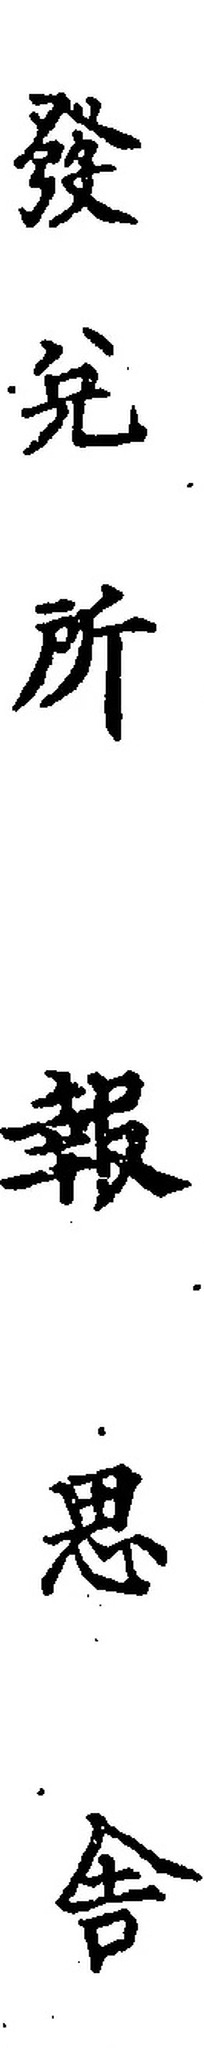發兌所報恩舎
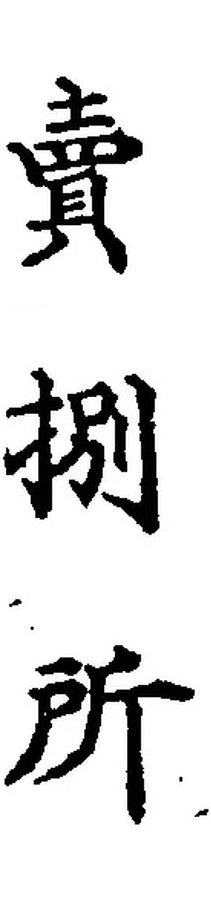賣捌所
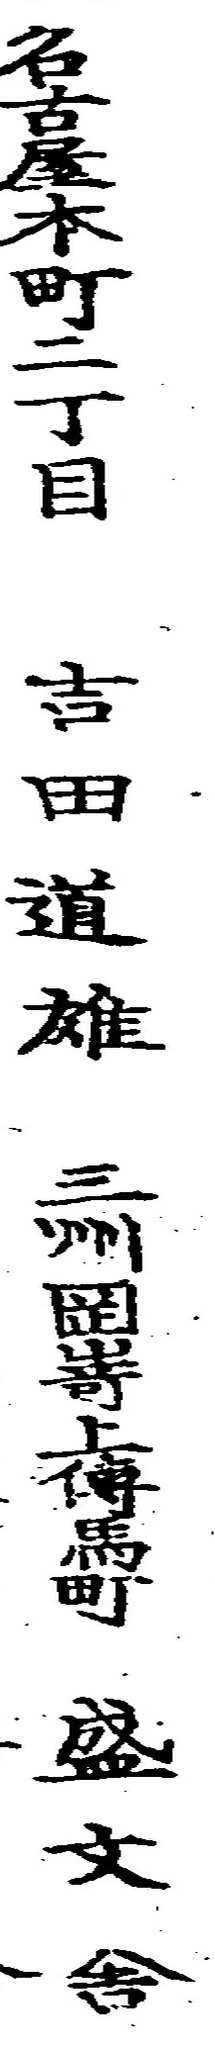名古屋本町二丁目吉田道雄三州岡嵜上傅馬町盛文舎
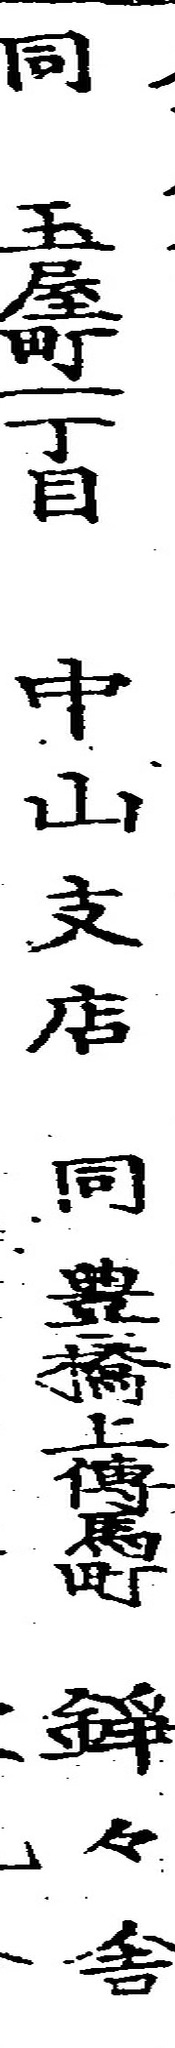同玉屋町一丁目中山支店同豊橋上傅馬町錚々舎
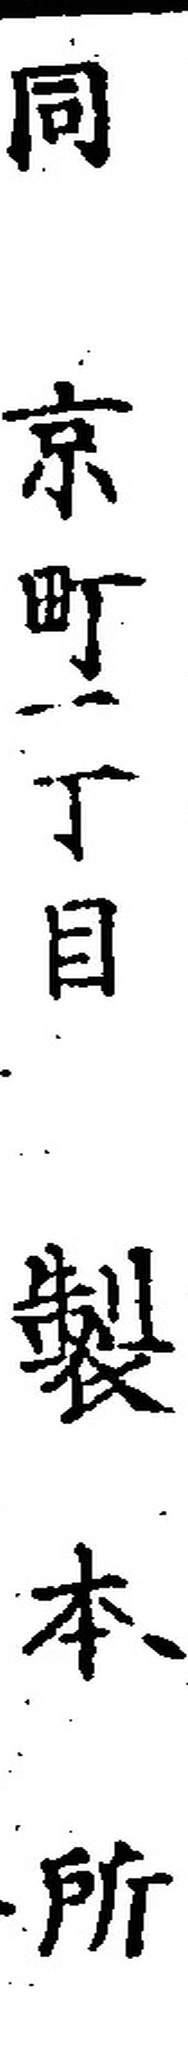同京町一丁目製本所
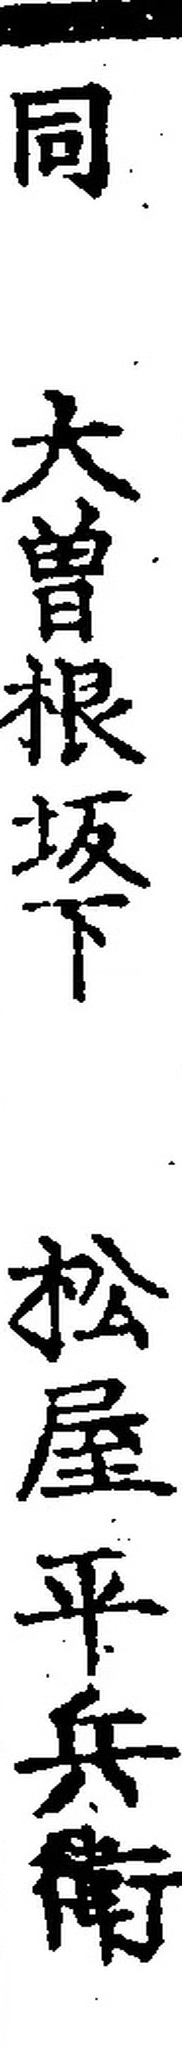同大曽根坂下松屋平兵衛
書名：虎列剌病予防用法
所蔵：国立国会図書館 National Diet Library, JAPAN
